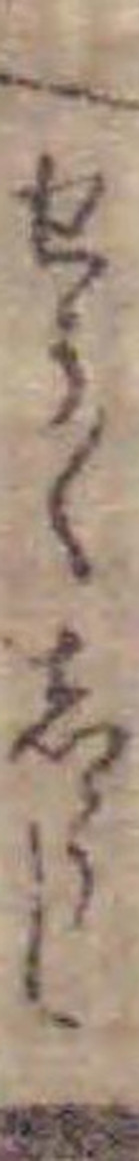せう〳〵しうし
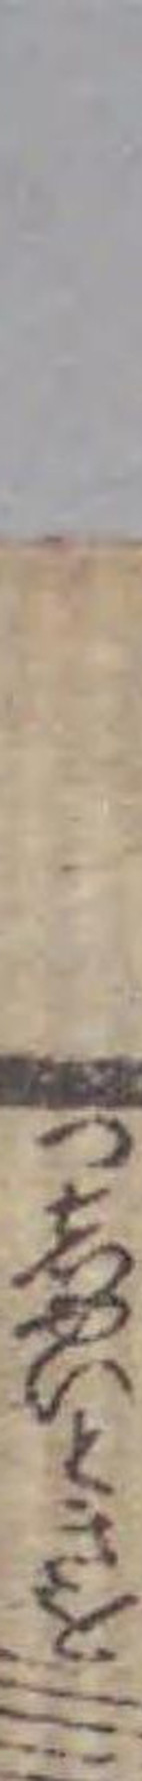つしやいときを
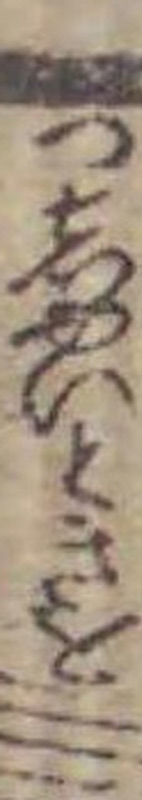つしやいときを
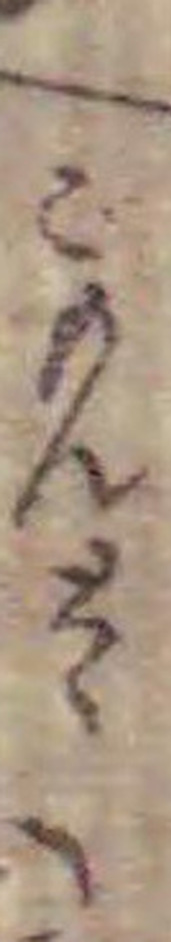ごもんとゝ
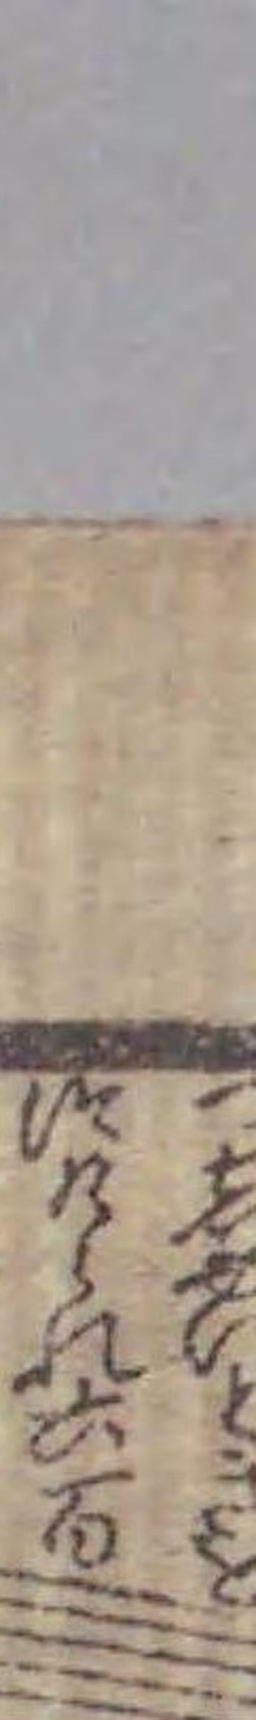つけられ六百
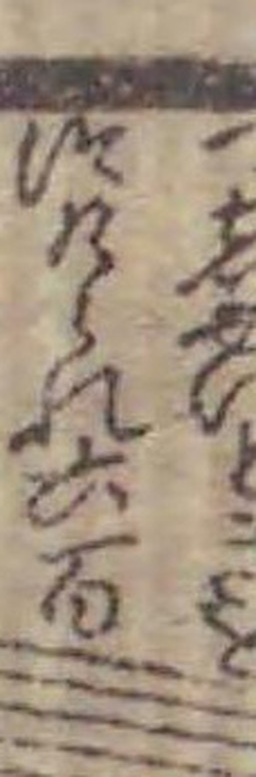つけられ六百
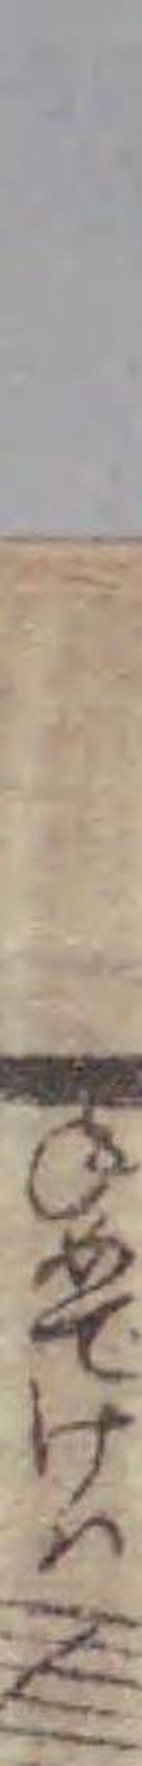年めでけは
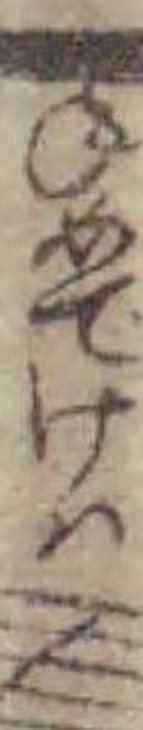年めでけは
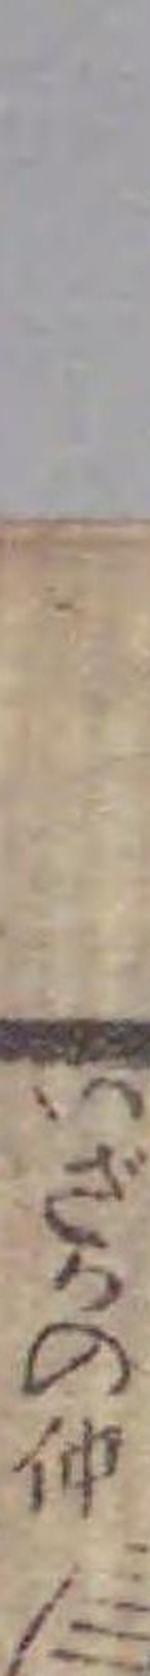いざかの仲
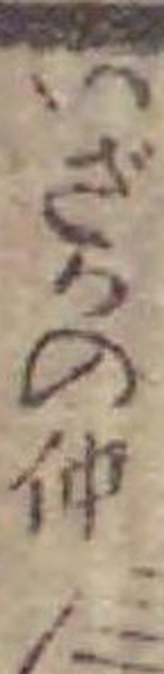いざかの仲
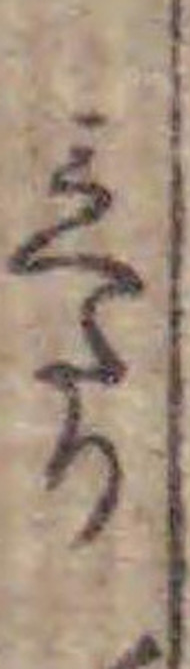みへたり
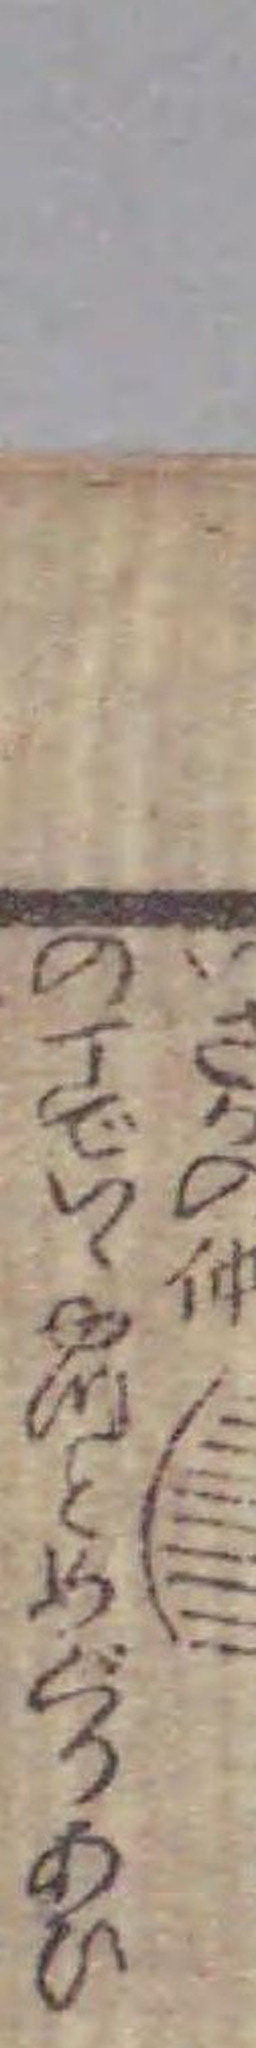の丁でいゝやつとめぐりあひ
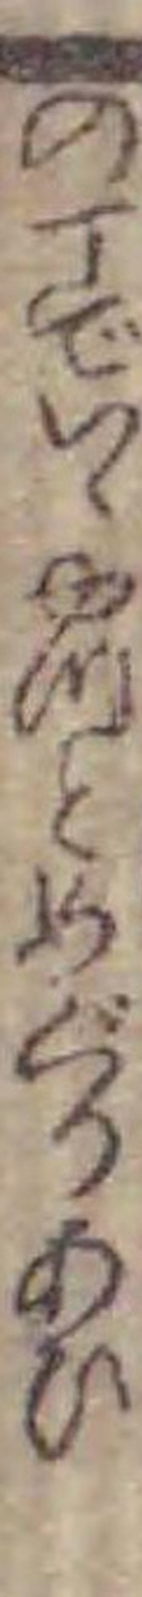の丁でいゝやつとめぐりあひ
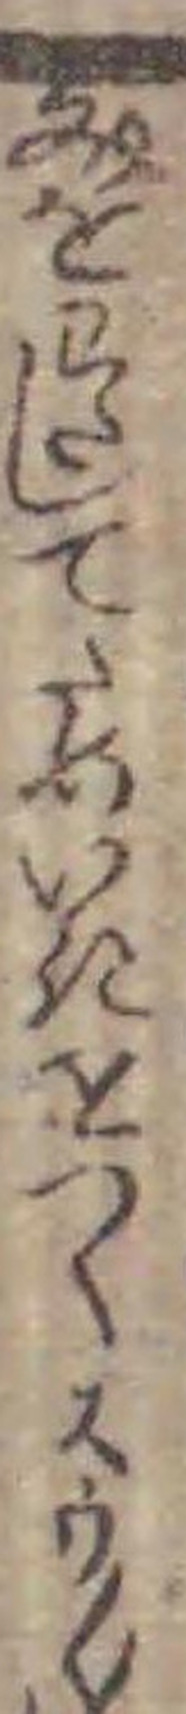文をわたしてためいきをつくスウ〳〵〳〵
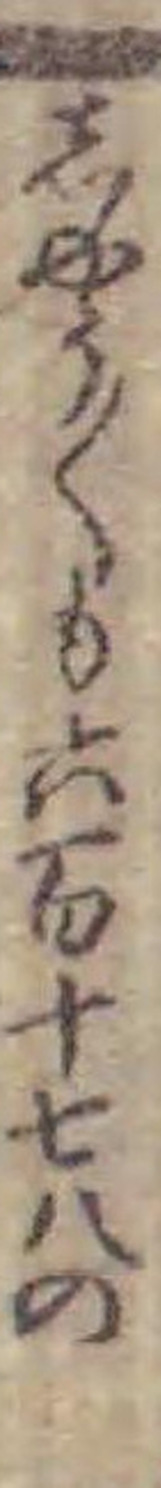しやう〳〵も六百十七八の
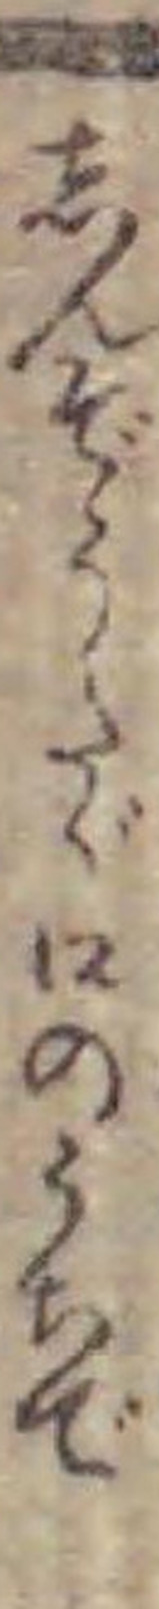しんぞうたゞ口のうちで
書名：年寄之冷水曽我 : 3巻
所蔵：国立国会図書館 National Diet Library, JAPAN
